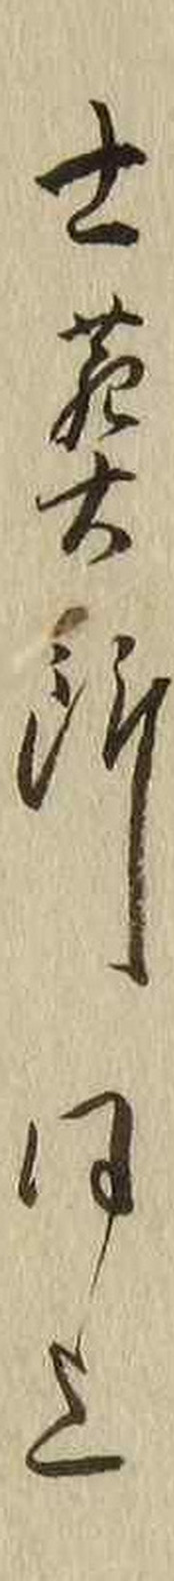士葬所同上
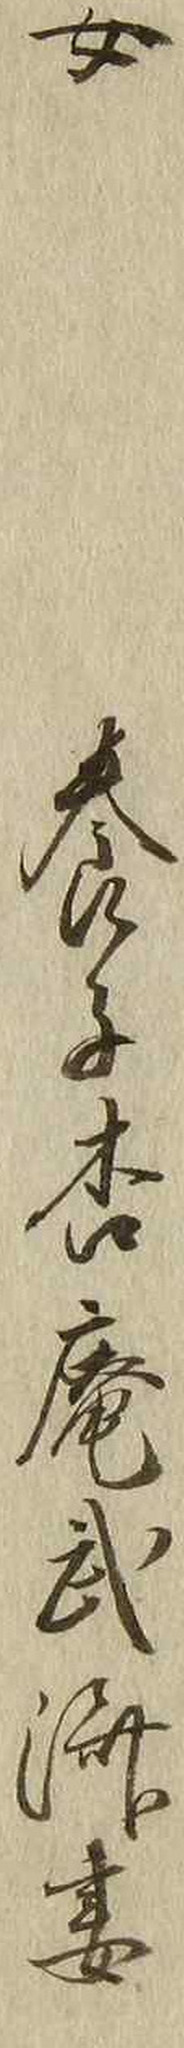女養子杏庵武濟妻
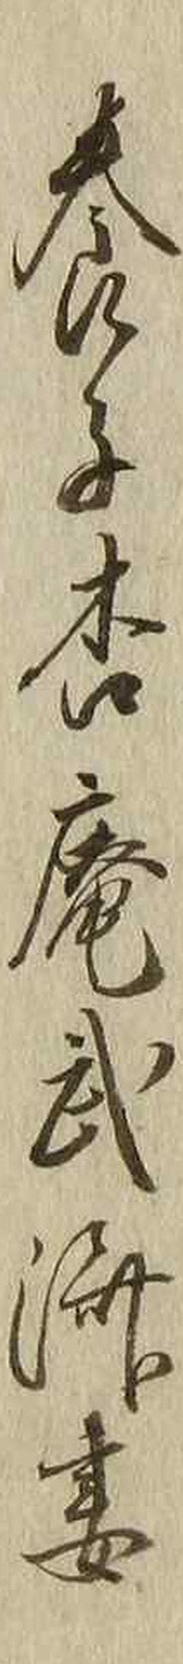女養子杏庵武濟妻
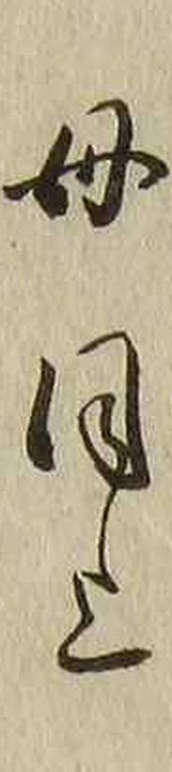母同上
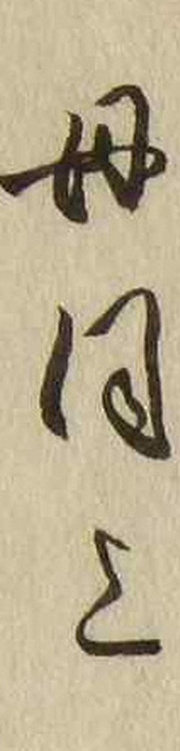母同上

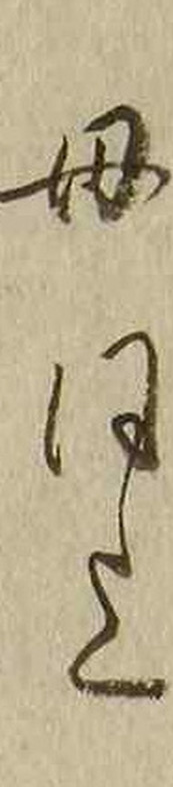母同上
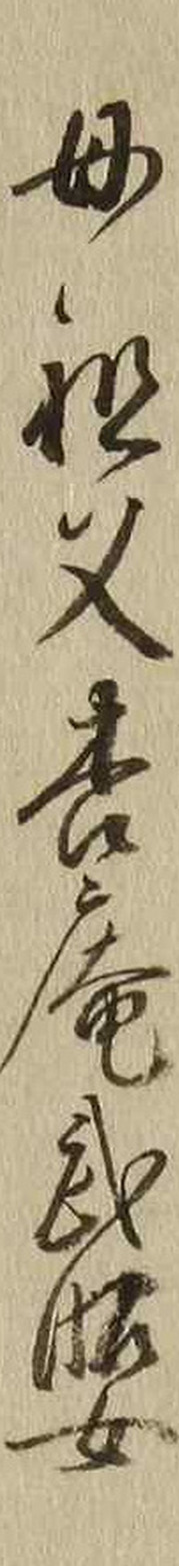母祖父杏庵武昭女
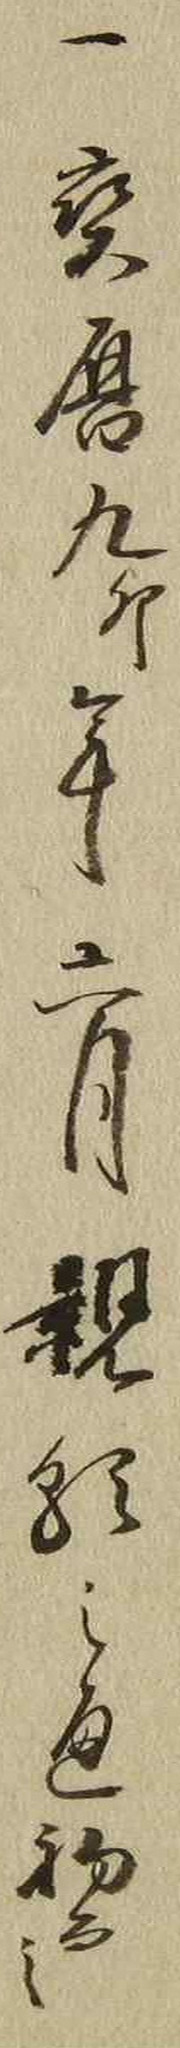一宝暦九卯年六月親願之通初而之
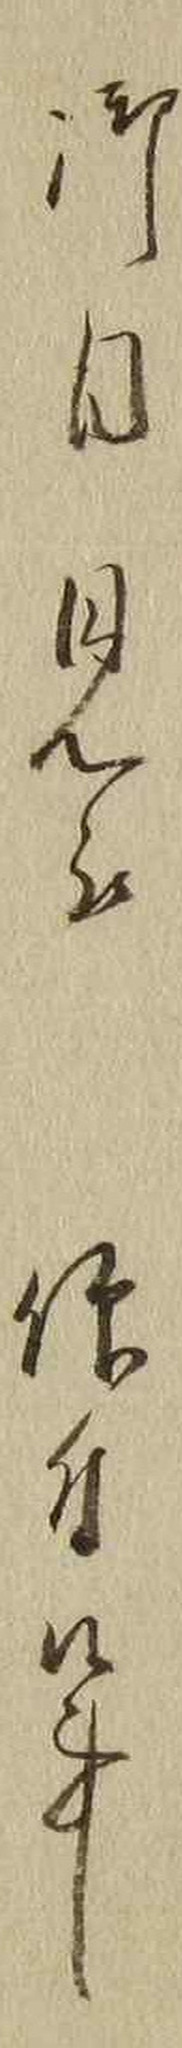御目見被仰付候事
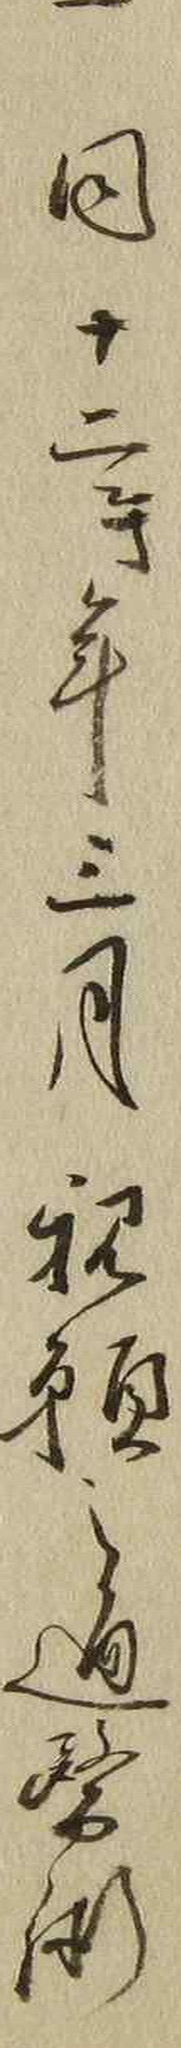一同十二午年三月親願之通医術
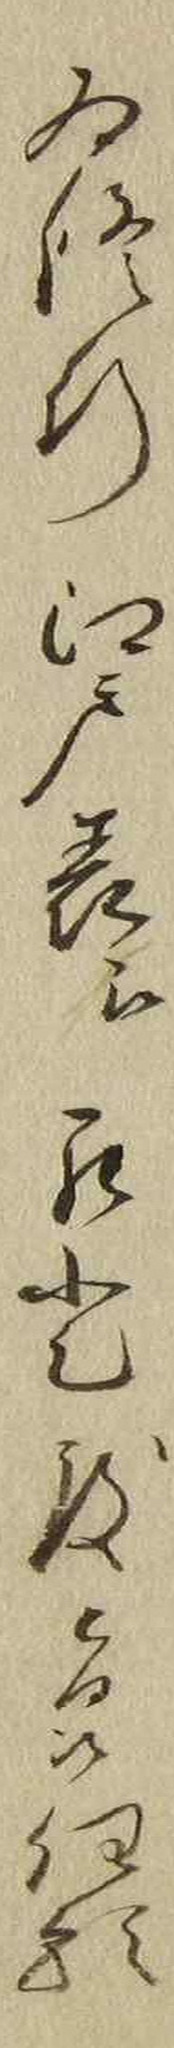為修行江戸表江罷登致旨被任願
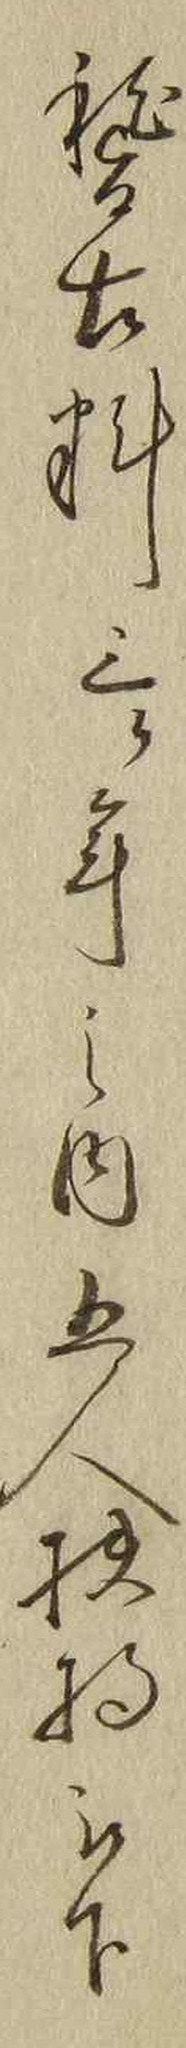稽古料三ヶ年之内五人扶持被下
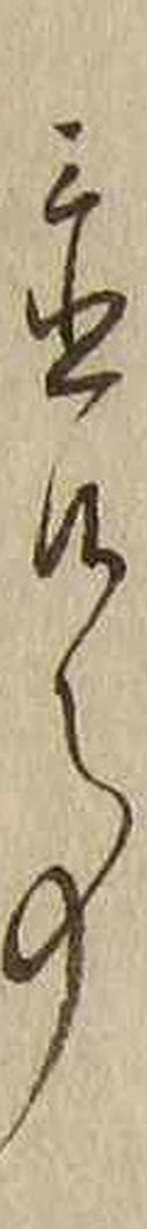置候事
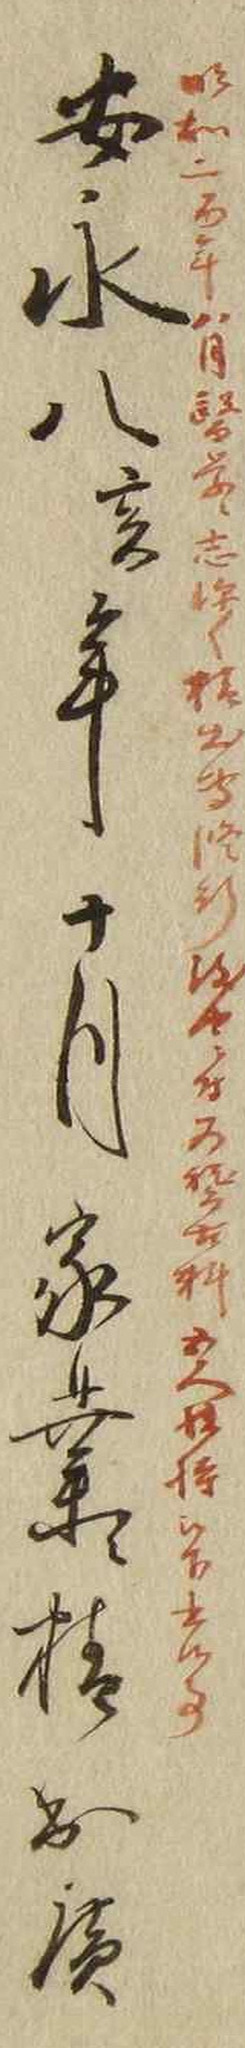一安永八亥年十月家業精出広

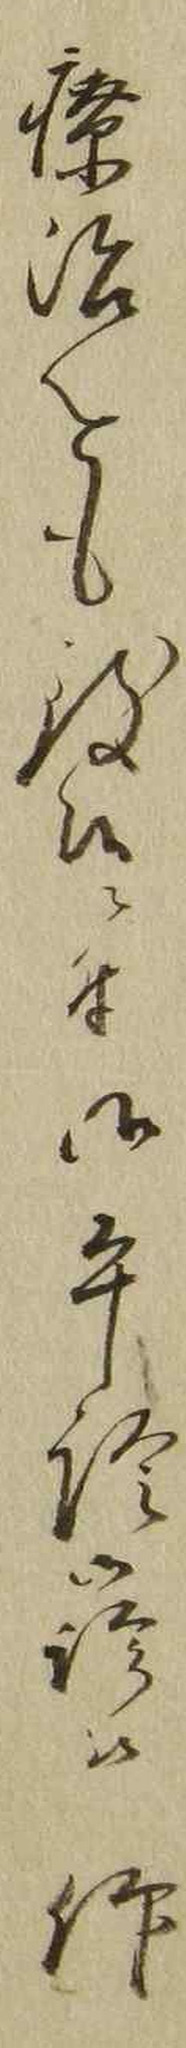療治をも致候ニ付御午診御診被仰
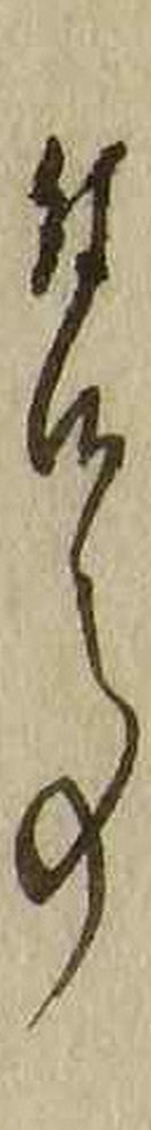付候事
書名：諸士系譜　巻之68　を之部2
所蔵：会津若松市立会津図書館
